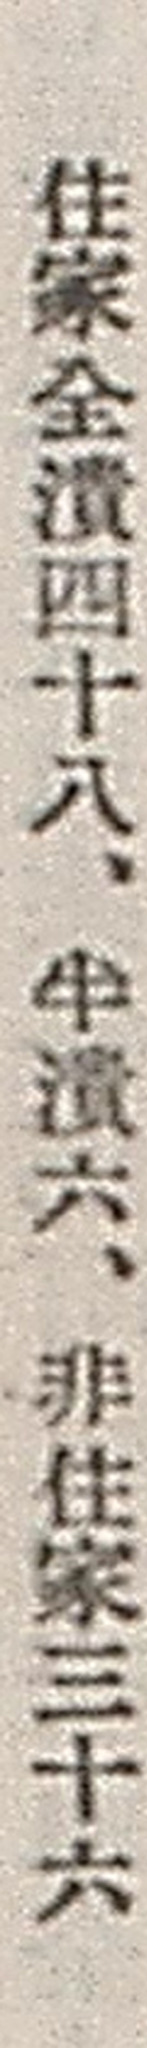住家全潰四十八、半潰六、非住家三十六
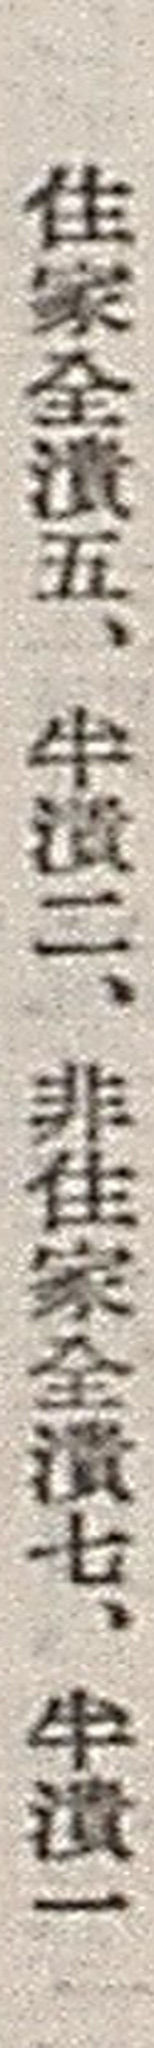住家全潰五、半潰二、非住家全潰七、半潰一
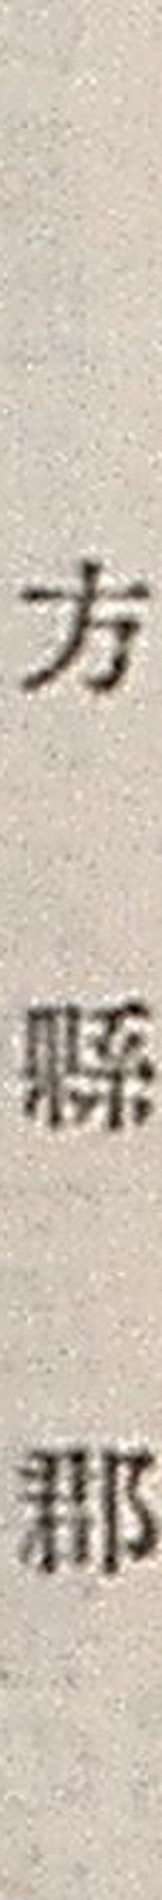方縣郡
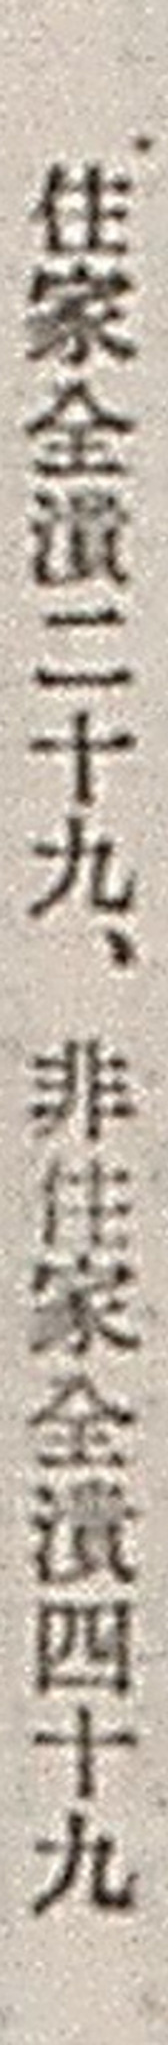住家全潰二十九、非住家全潰四十九
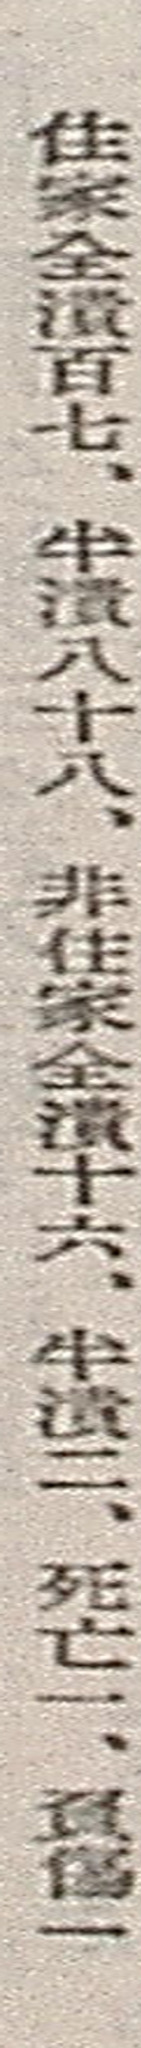住家全潰百七、半潰八十八、非住家全潰十六、半潰二、死亡一負傷一
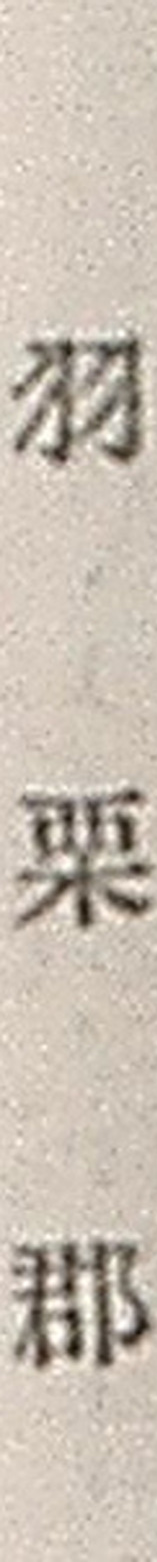羽栗郡
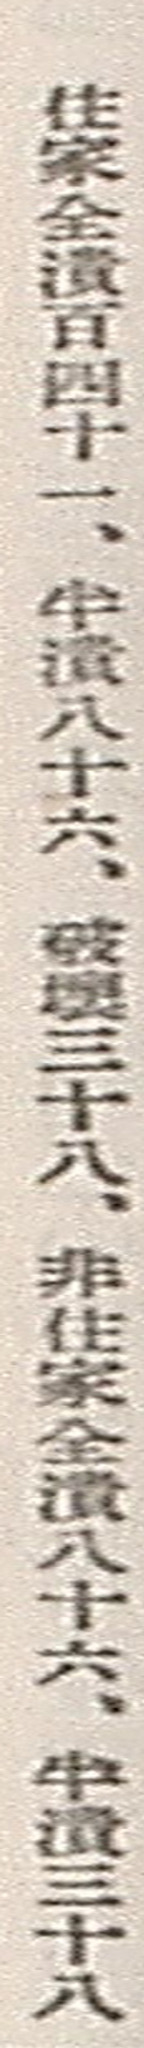住家全潰百四十一、半潰八十六、破壊三十八、非住家全潰八十六、半潰三十八
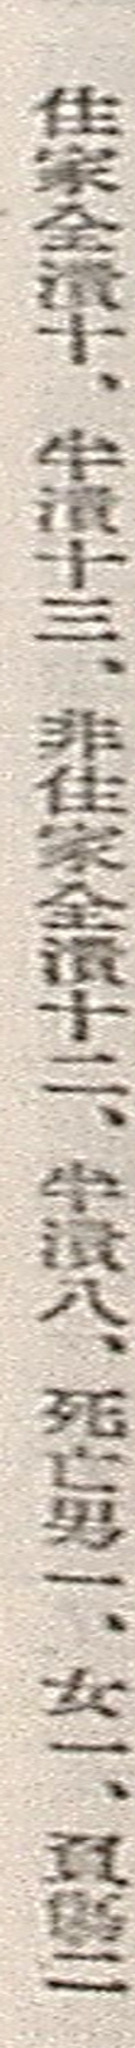住家全潰十、半潰十三、非住家全潰十二、半潰八、死亡男一、女一、負傷二
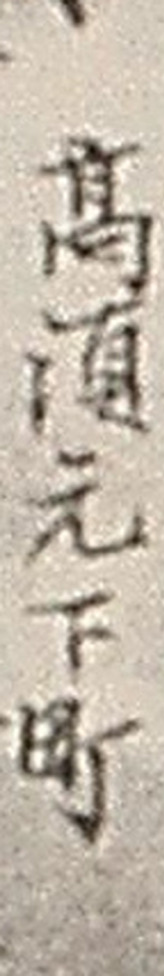高須元下町
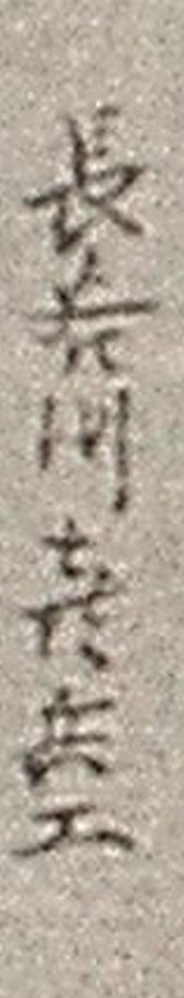長谷川喜兵ヱ
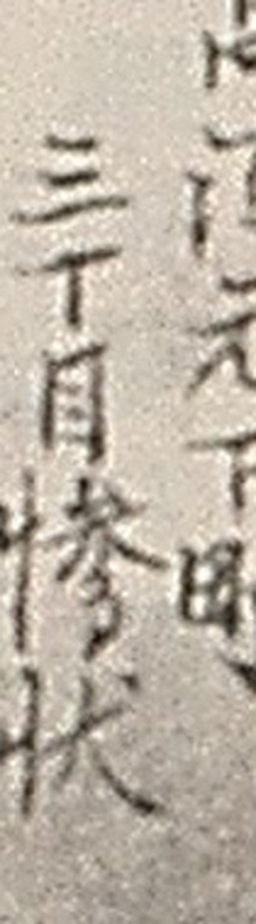三丁目惨状
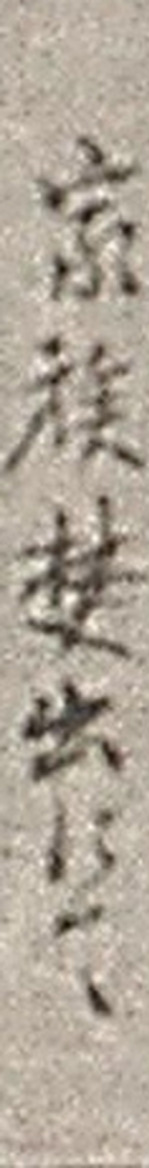家族焚出にて
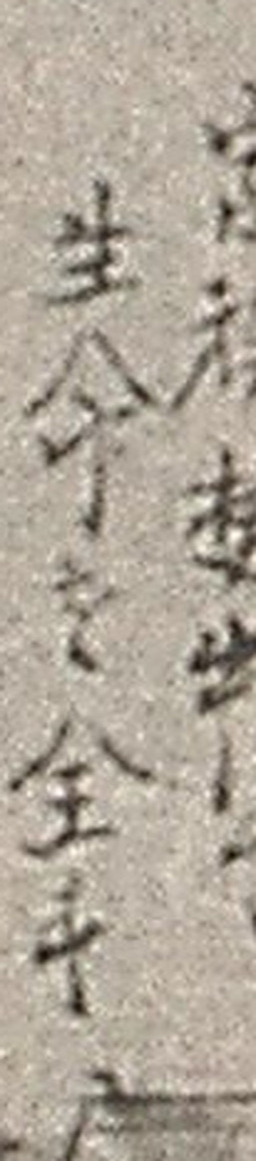生命を全す
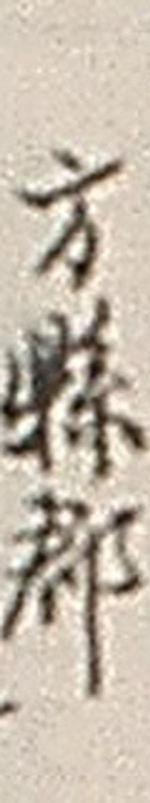方縣郡
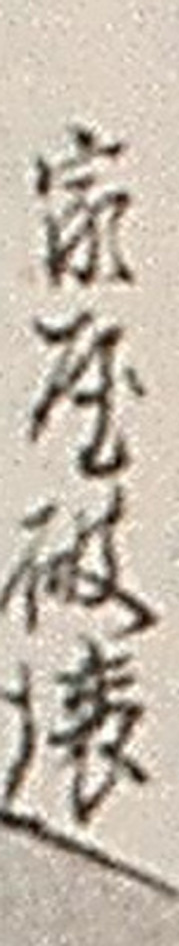家屋破壊

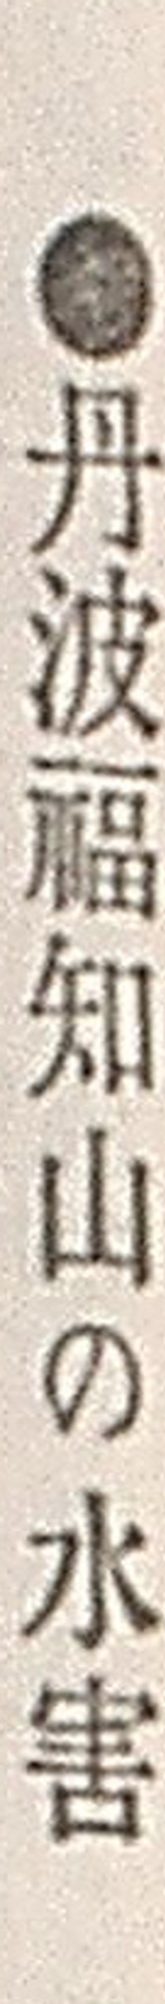●丹波福知山の水害
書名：風俗畫報臨時増刊第百二十六號　洪水被害録（中）
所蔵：東京大学地震研究所図書室 Earthquake Research Institute Library, The University of Tokyo, JAPAN
